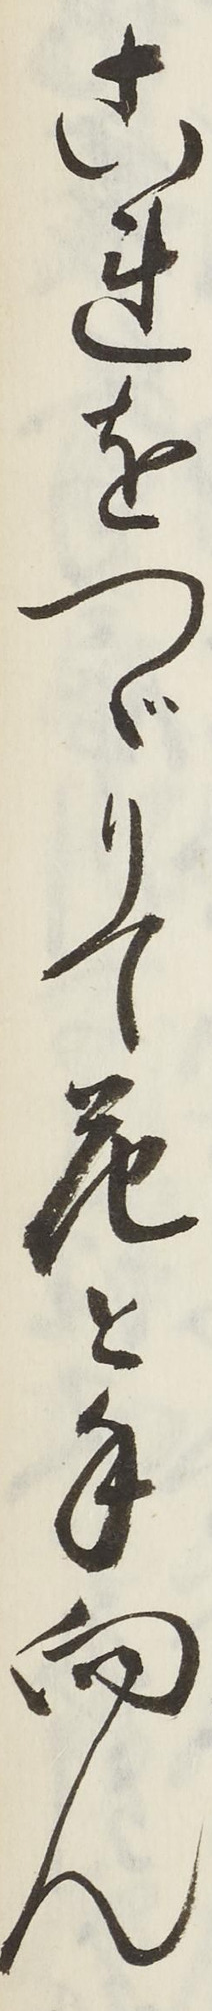これをつゞりて花と手向ん

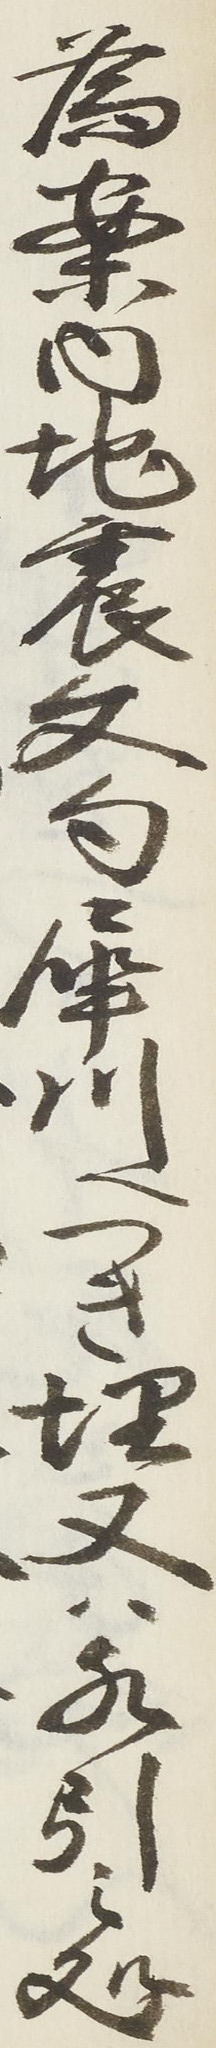為案内地震文句犀川へつき埋又ハ水引之処
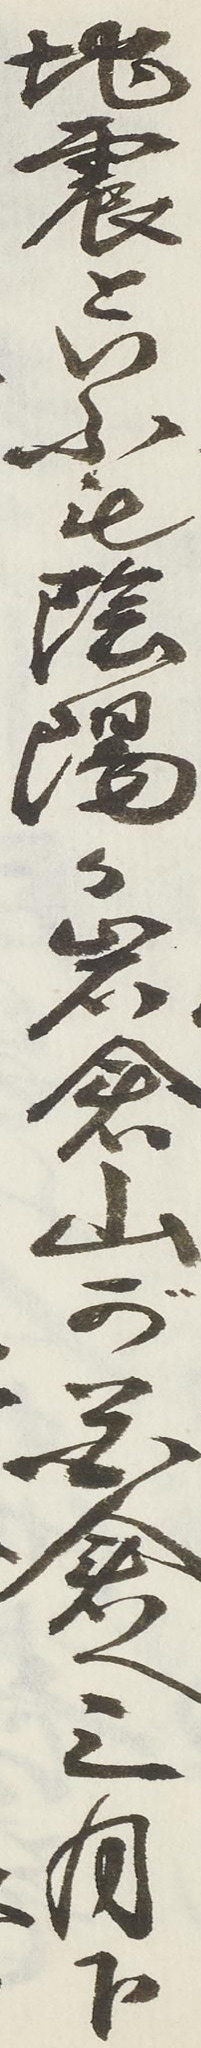地震といふも陰陽か岩倉山が花倉へ三月下
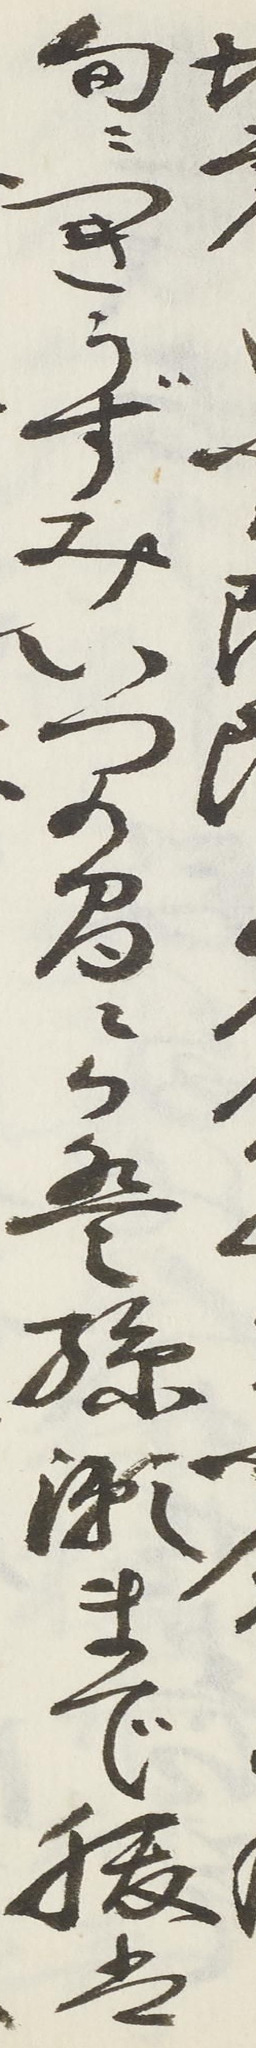旬二つきうずみいつの間二かは孫瀬まで腹は
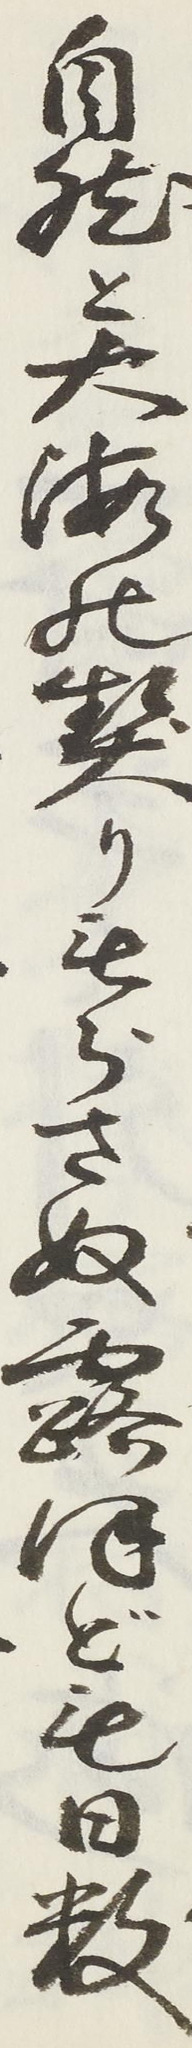自然と大海の契りもらさぬ露ほども日数
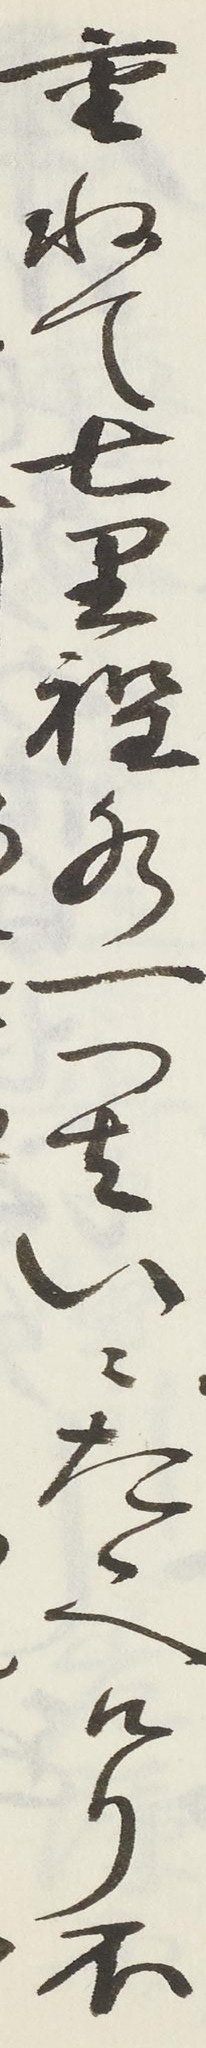重ねて七里程水一つはい二たゝへけりほ
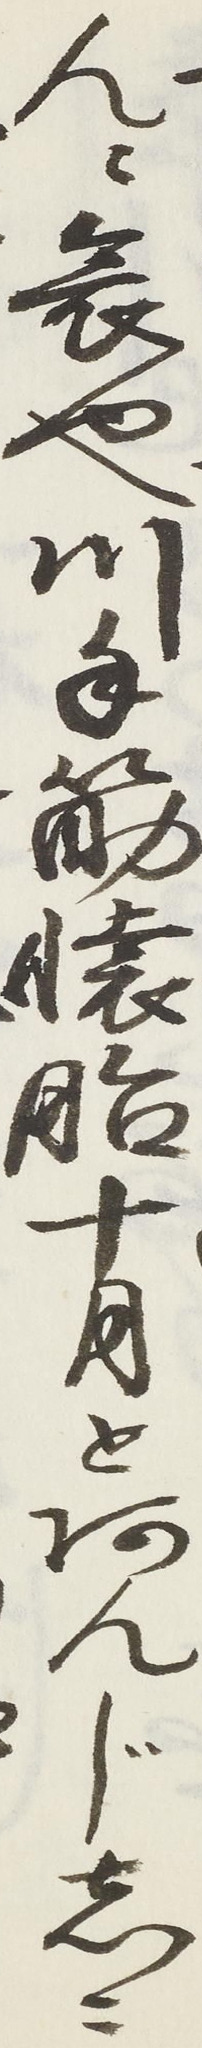ん二衰や川手筋懐胎十月とあんじし二
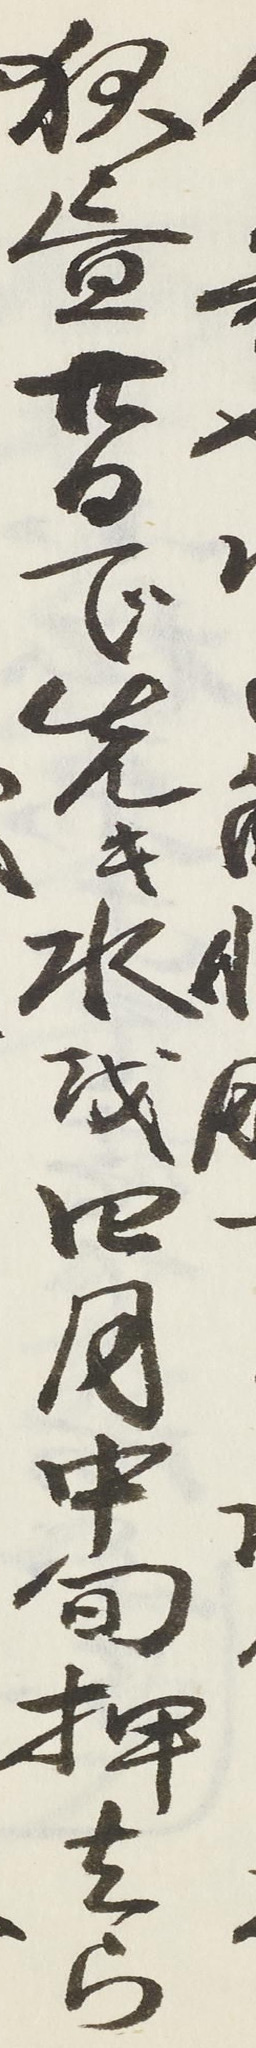昼夜廿日で先キ水を四月中旬押はら
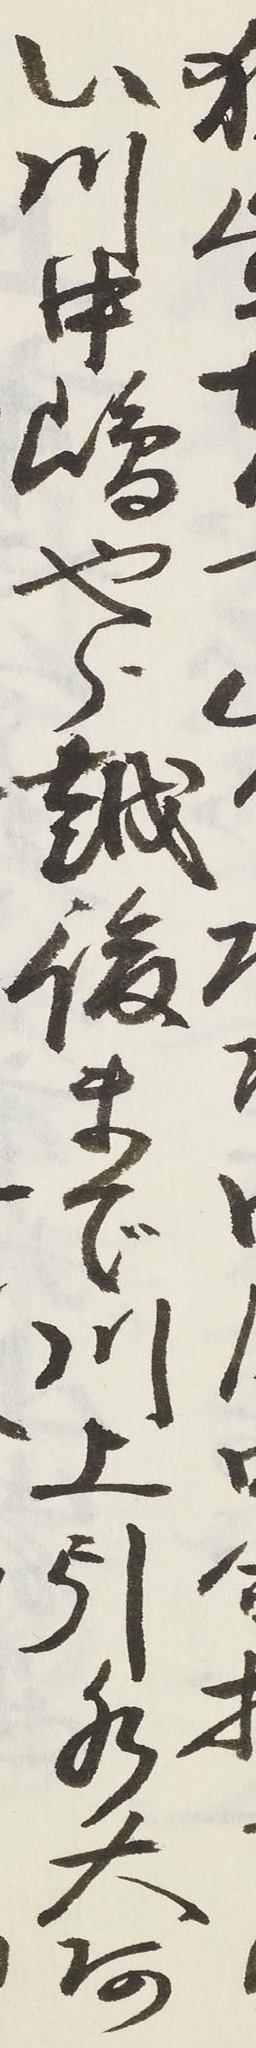い川中嶋やら越後まで川上引水大あ
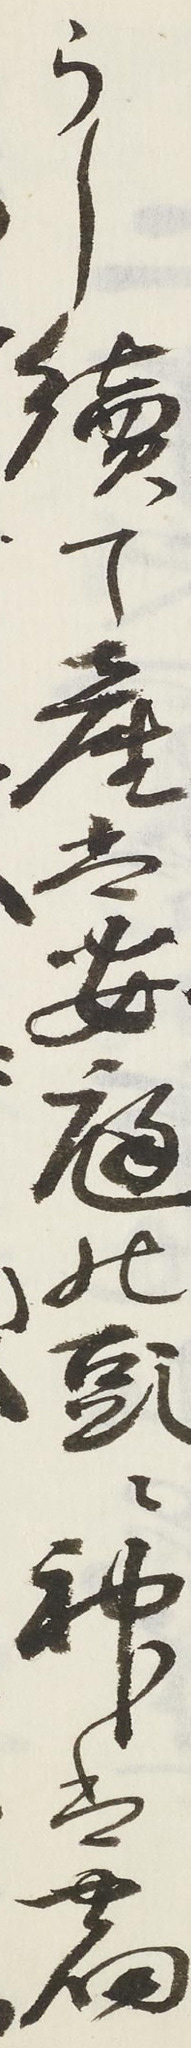らし続て産は安庭の頭二神は宿
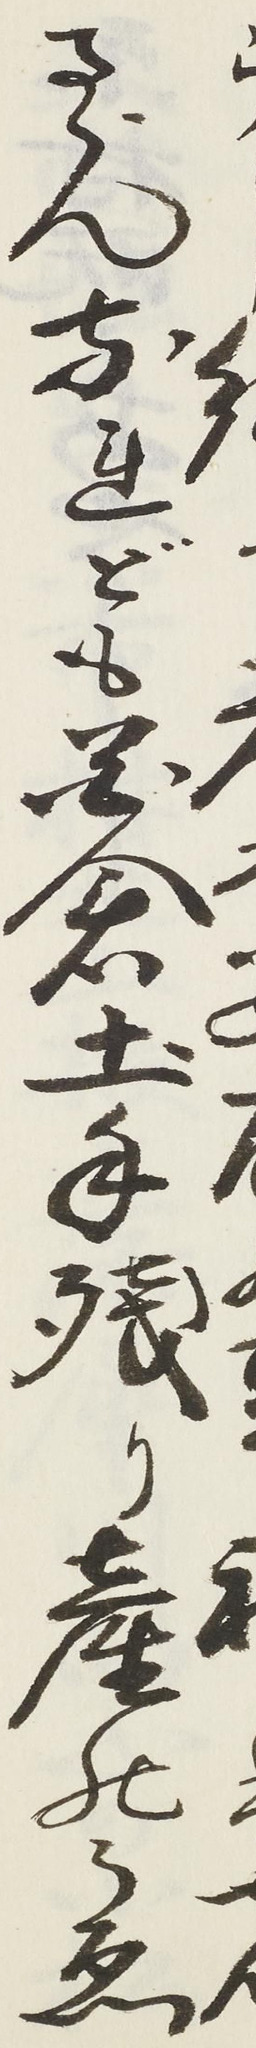るらんなれども花倉土手残り産のうゑ
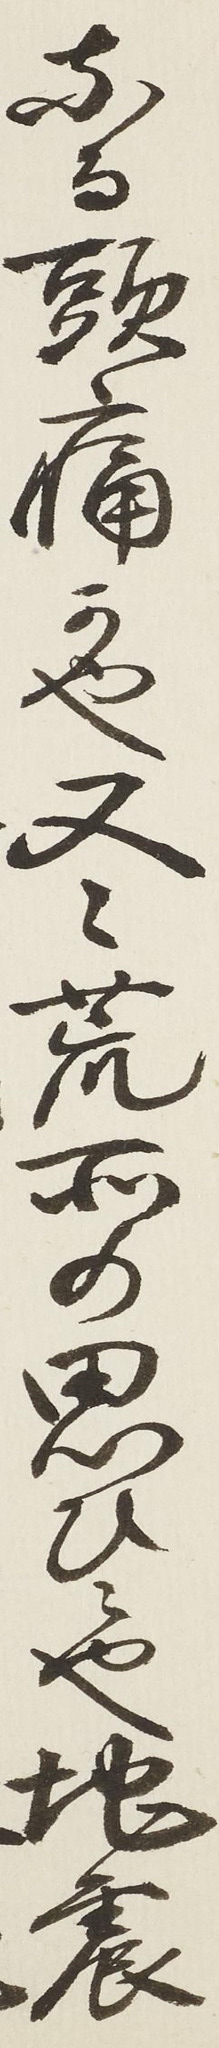なる頭痛かや又々荒所の思ひ二や地震
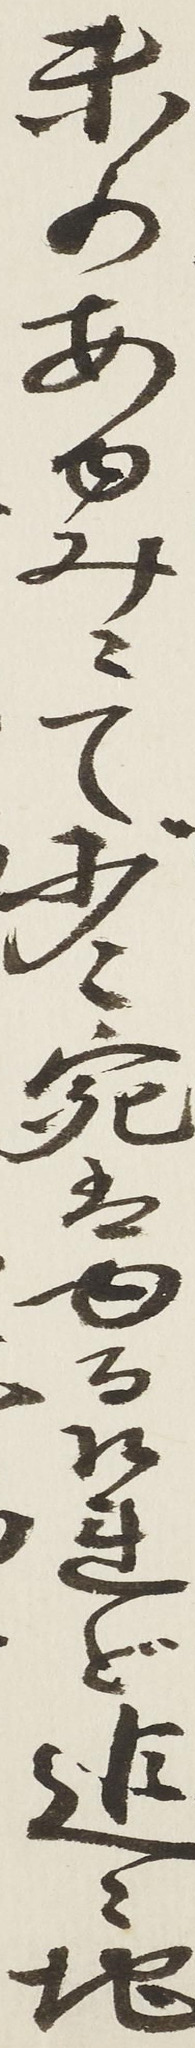未のあゆみ二て少々宛はゆるけれど追々地
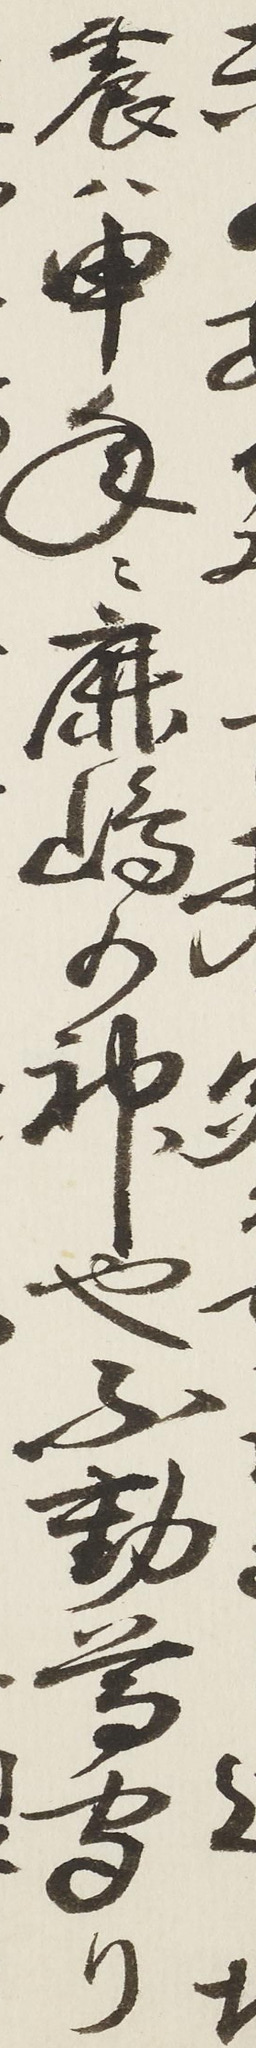震ハ申年二廉嶋の神や不動尊守り
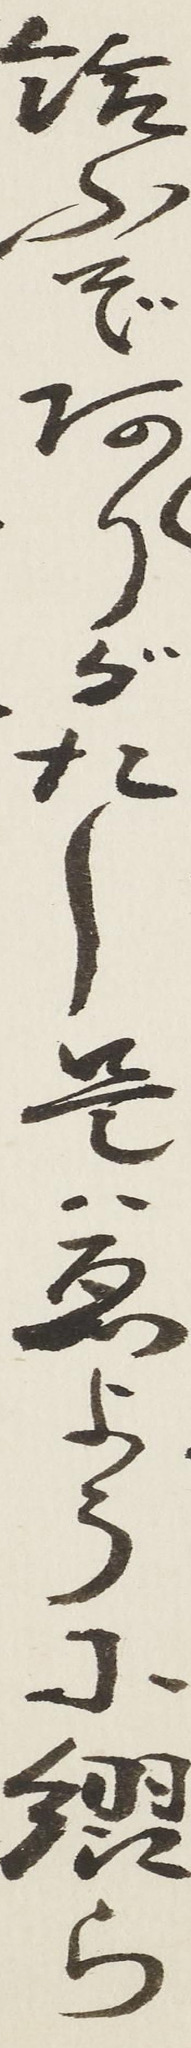給ふぞありがたし是ハゑように躍ら
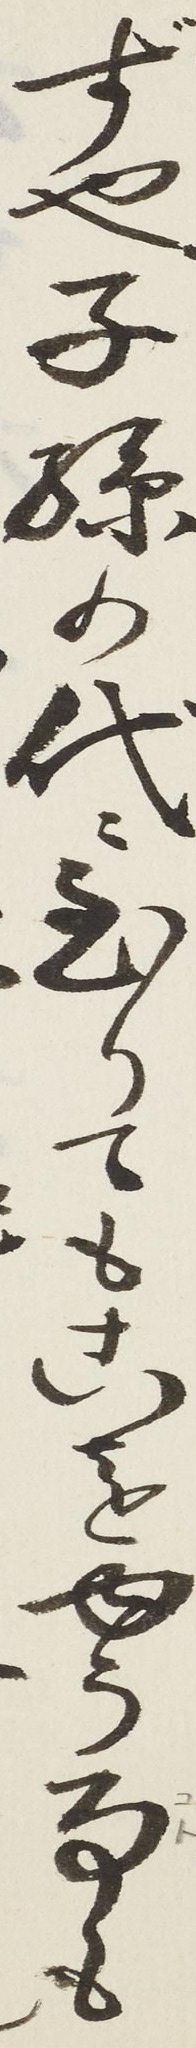ずや子孫の代に至りてもこをゆう事も
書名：弘化四年地震記
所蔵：東京大学地震研究所図書室 Earthquake Research Institute Library, The University of Tokyo, JAPAN
